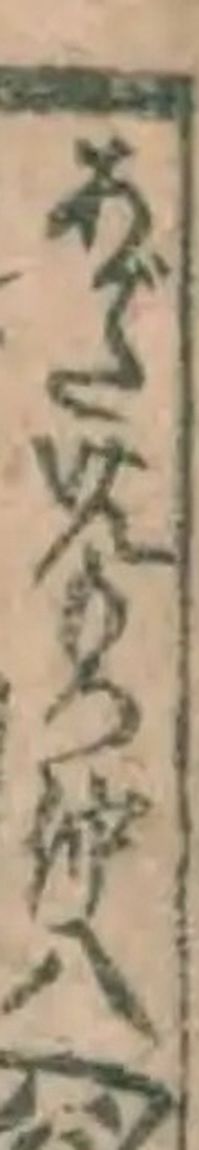あがたけんもつ仲八
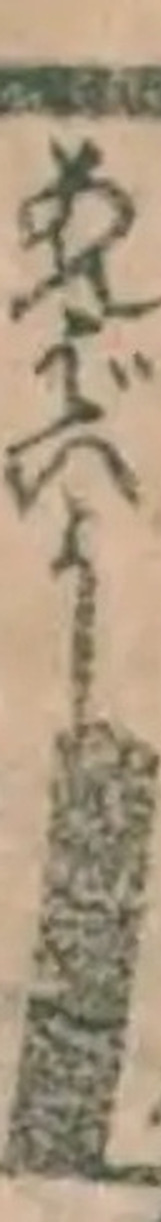あんばいよし
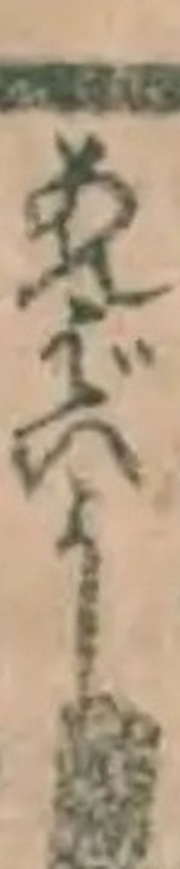あんばいよし
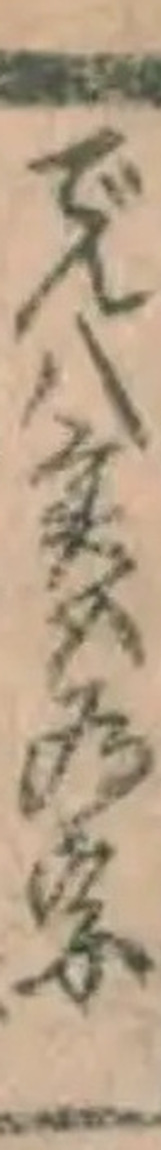でん八実は為宗
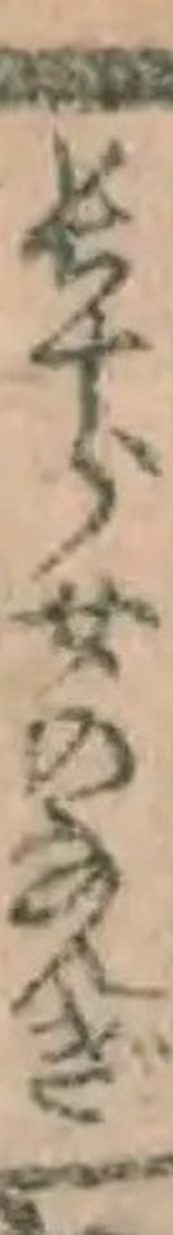長十郎女のなんぎ
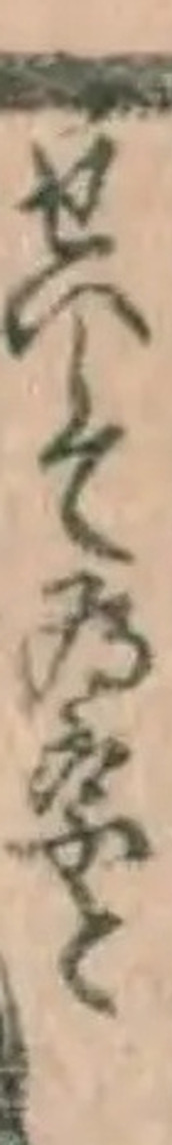せはして為宗と
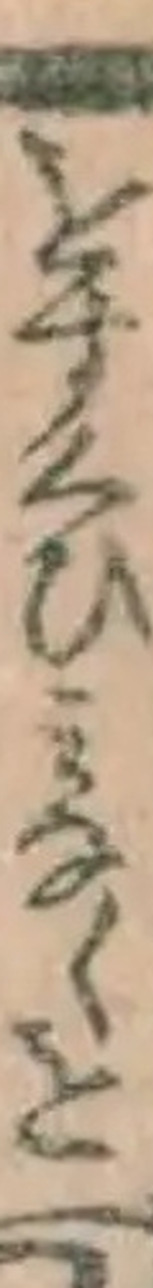をすくひみな〳〵を
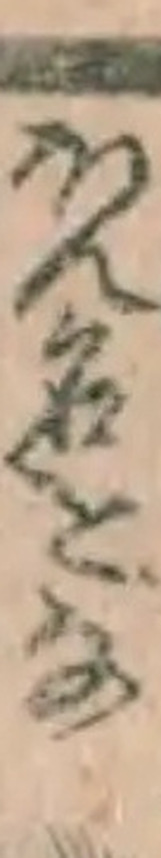ほん名をな
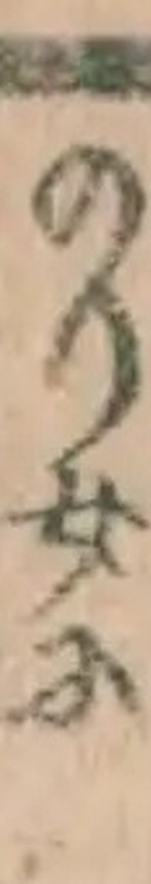のり女に
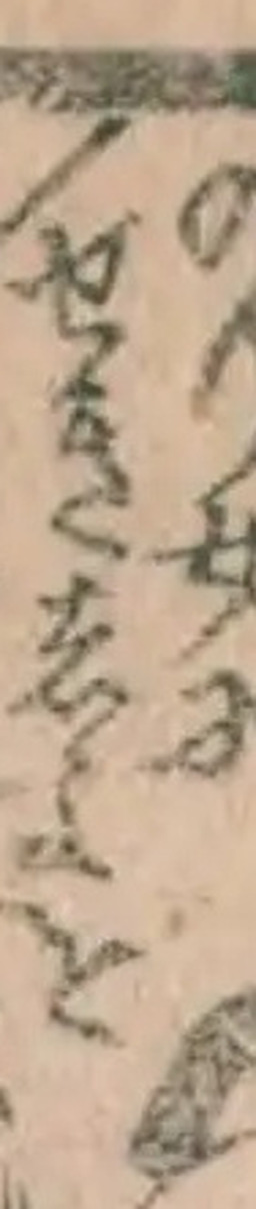せきしよを
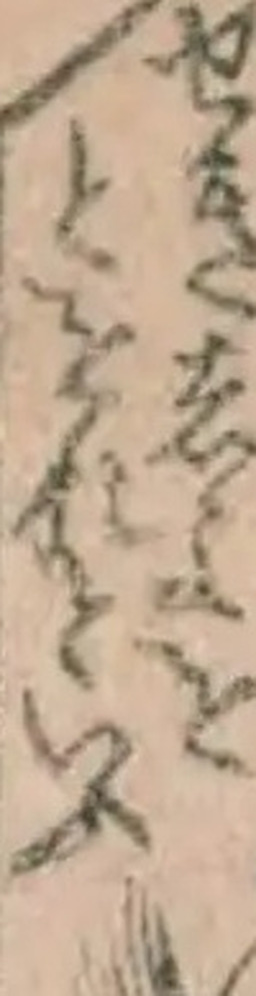とをれといふ
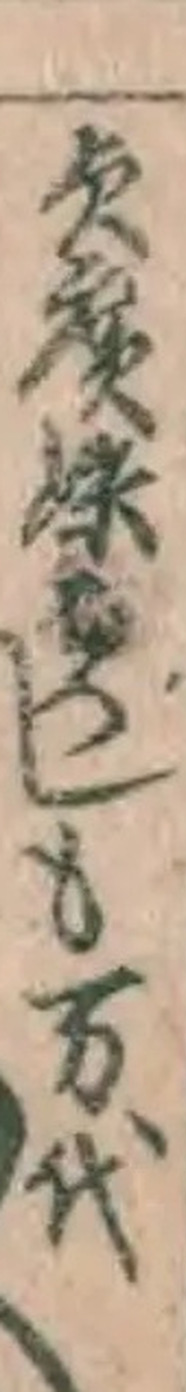貞広妹はつしも万代
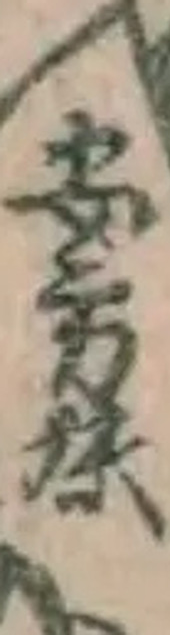安方妹
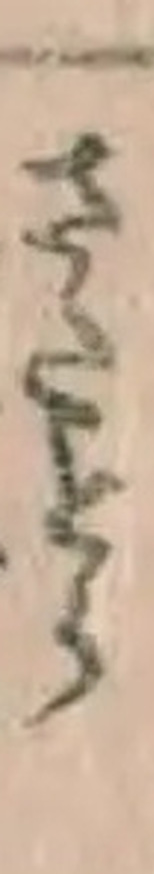さたとう
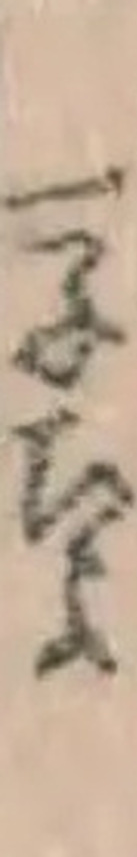一子ちよ
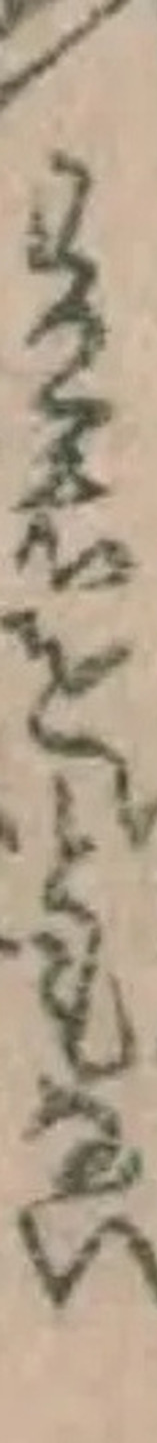わか君をともない
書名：伊達錦對将 : 森田座
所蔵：国立国会図書館 National Diet Library, JAPAN
